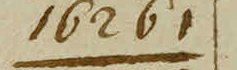16261
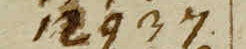12937
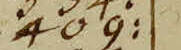409:
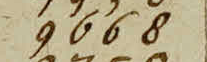9668
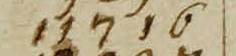11716
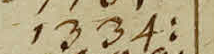1334:
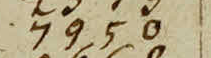7950
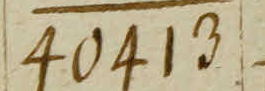40413
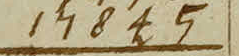17845
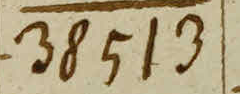38513
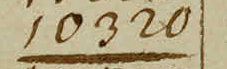10320
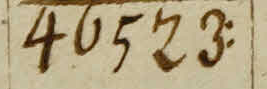46523:
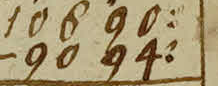9094:
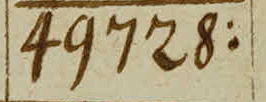49728:
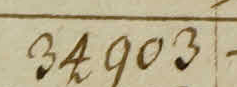34903
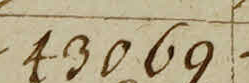43069
